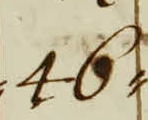46
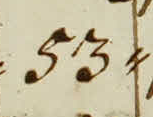53
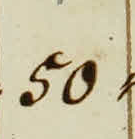50
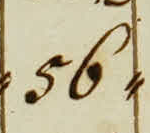56
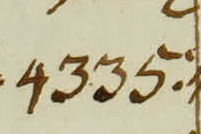4335
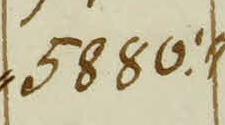5880.
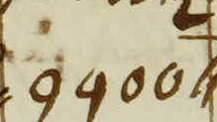9400
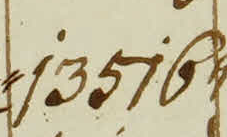13516
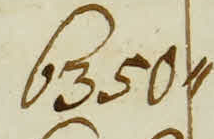6350
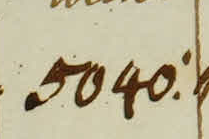5040.
